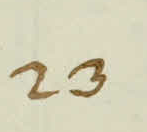23
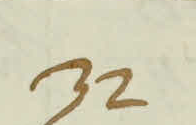32
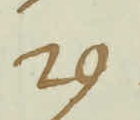29
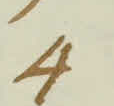4
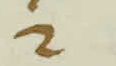2
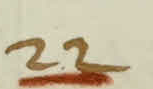22
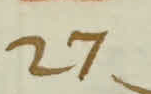27
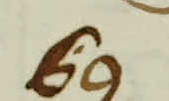69
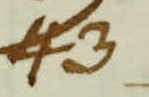43
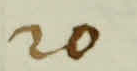20
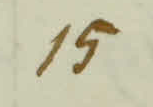15
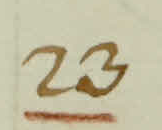23
